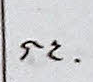52
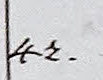42.
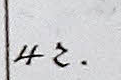42.
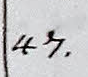47
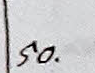50.
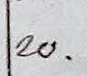20
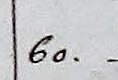60.
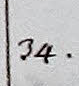34
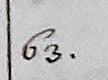63.
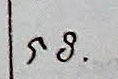58.
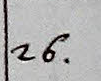26.
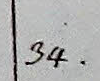34
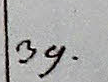39.
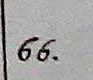66.
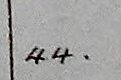44.
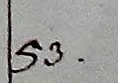53.
